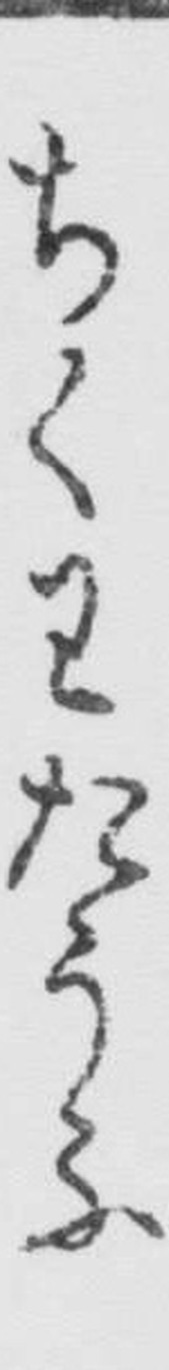ちくわたうふ
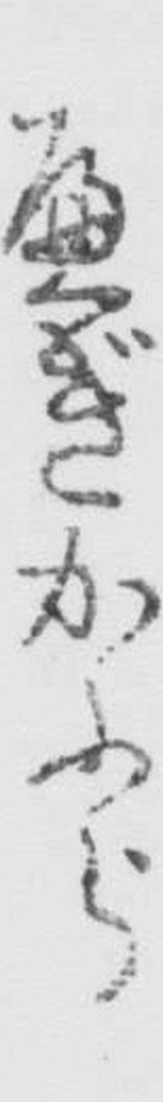へぎかふら
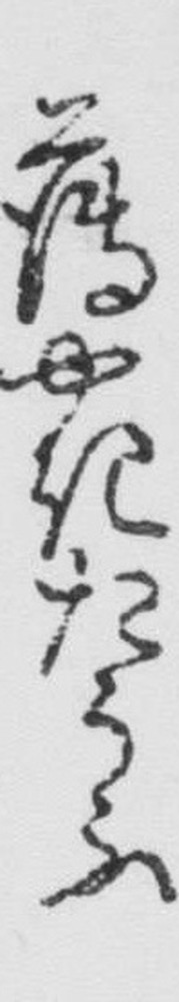薄やきたうふ
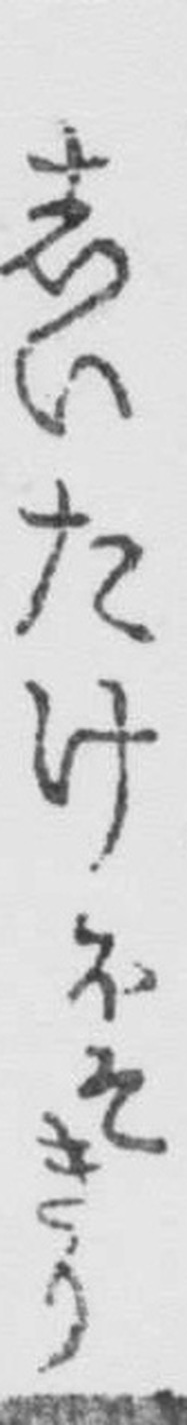しいたけほそきり
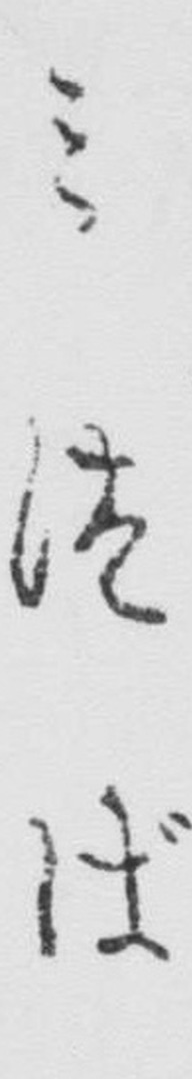みつば
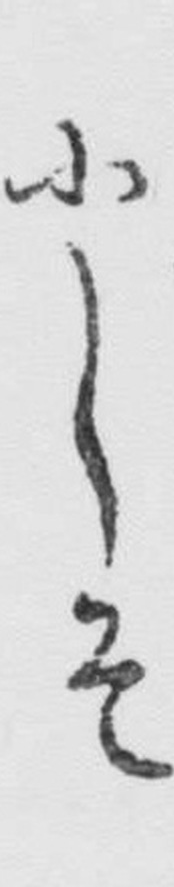小しそ
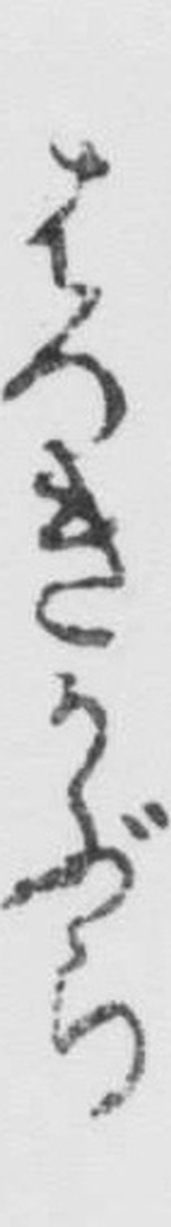はつきかぶら
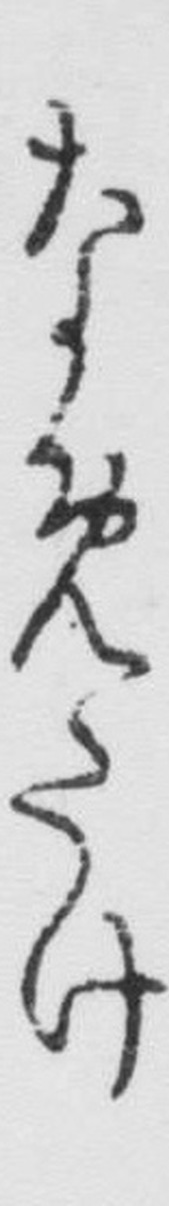なめたけ
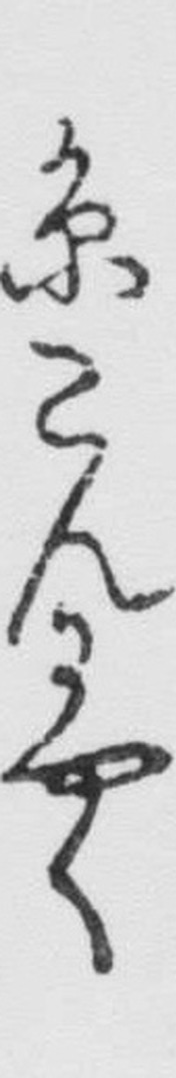糸こんにやく
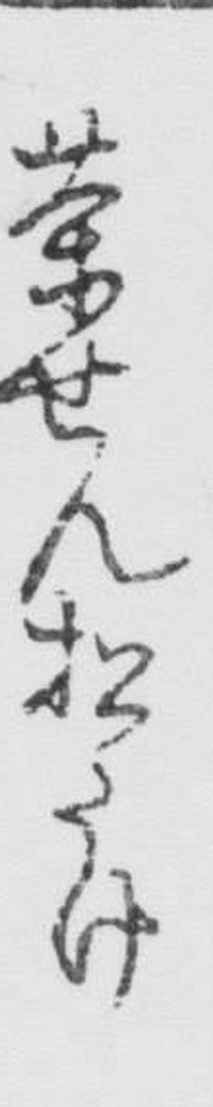茶せん松たけ
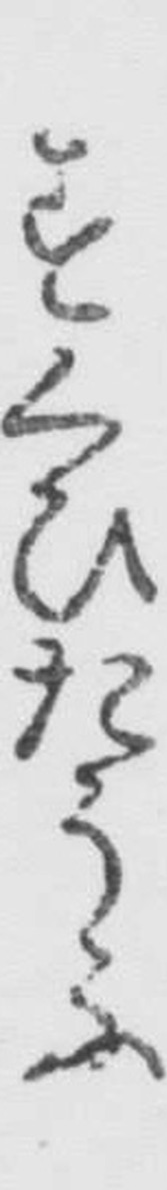すくひたうふ
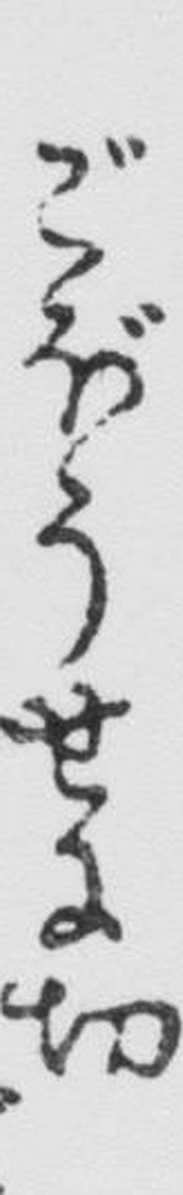ごぼうせに切
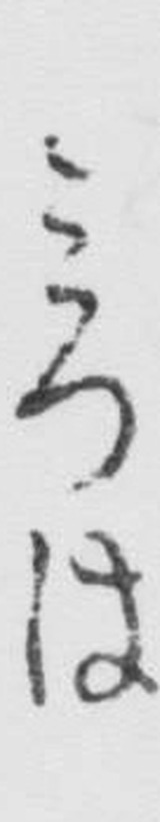みつは
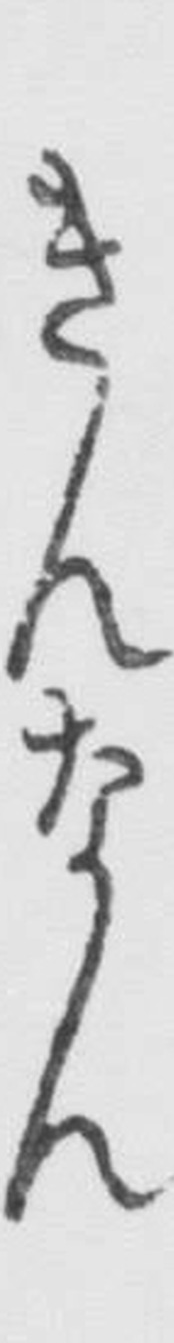きんなん
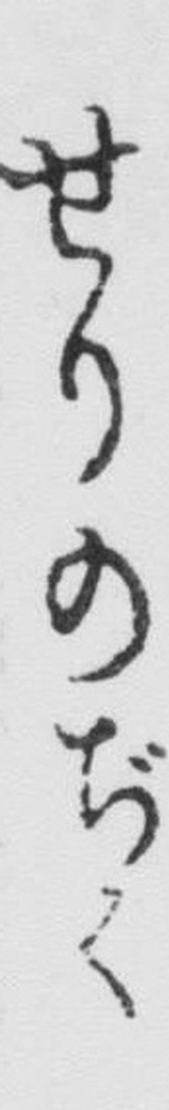せりのぢく
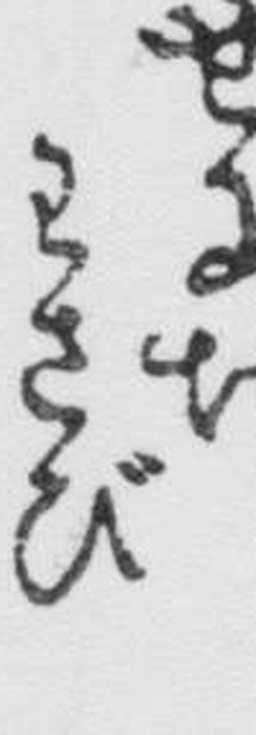わさび
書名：諸家通用/即席料理
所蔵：大阪府立大学学術情報センター 国文学研究資料館
